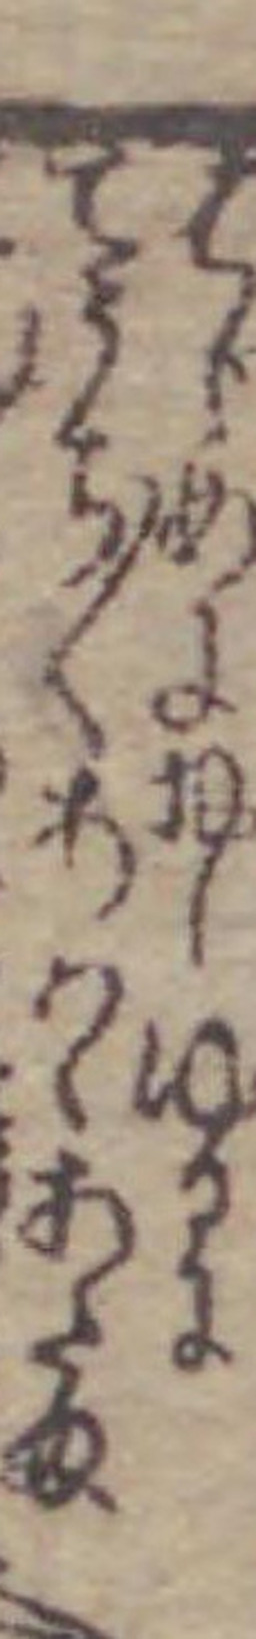てうち〳〵あはゝあたま
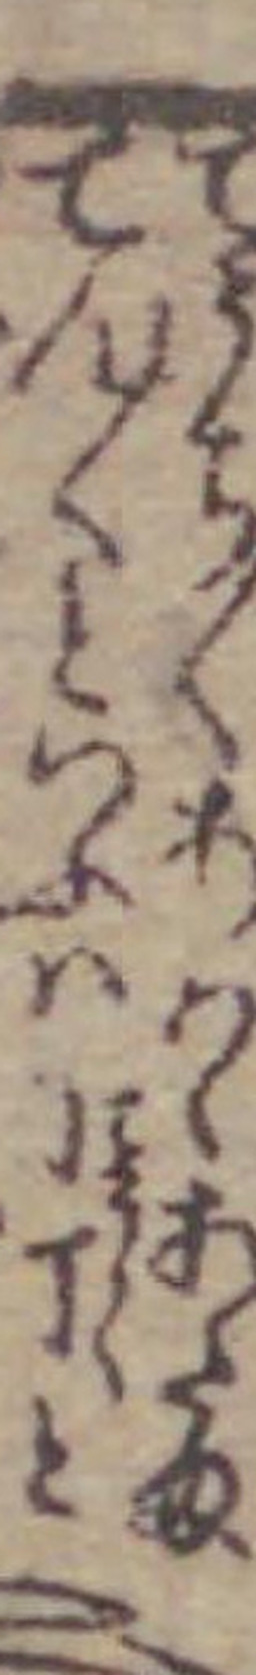てん〳〵といふは丁丁と
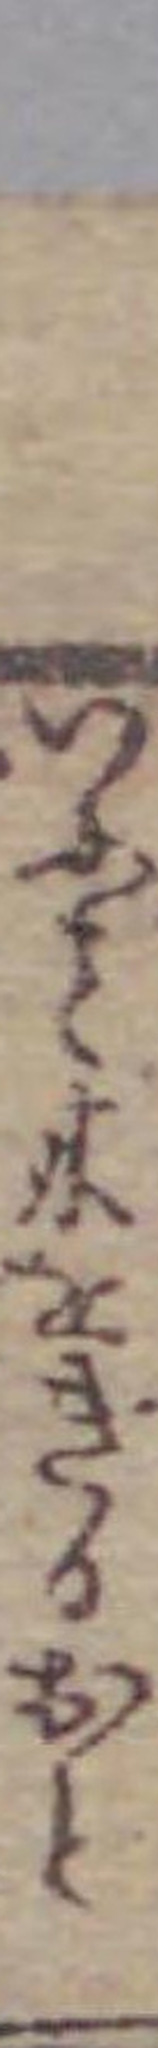いふこと木をきるおと
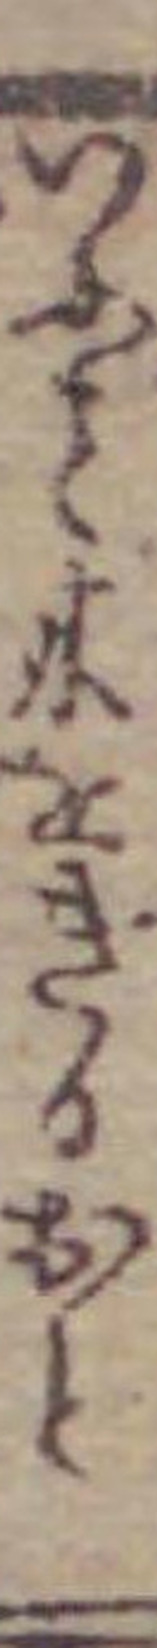いふこと木をきるおと
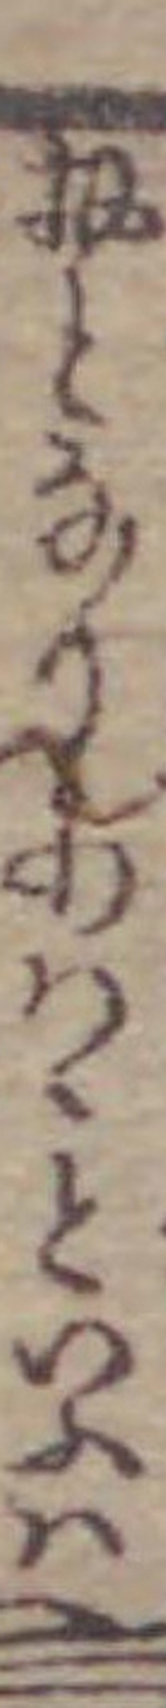おとなりあはゝといふは
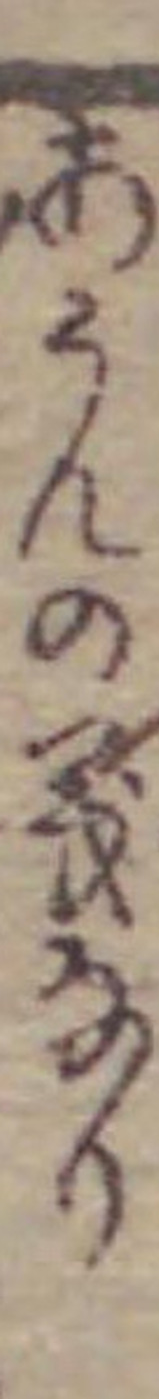あうんの義なり
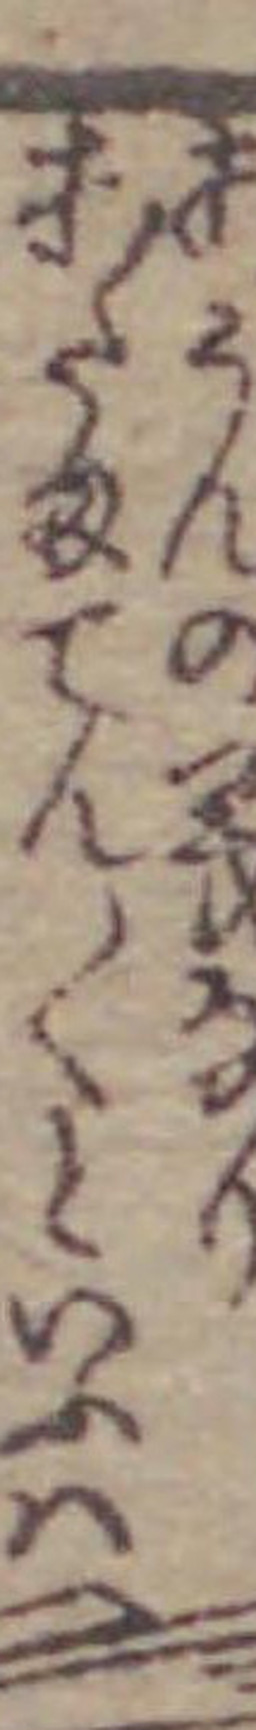あたまてん〳〵といふは
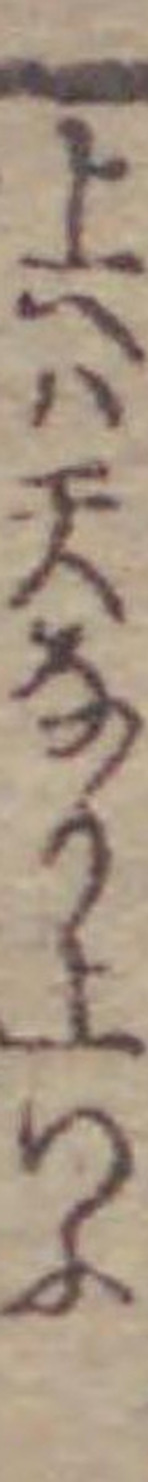上へは天なり上いふ
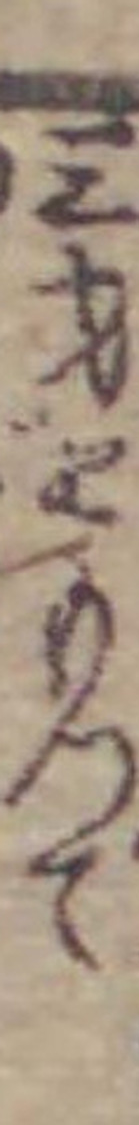三才をもつて
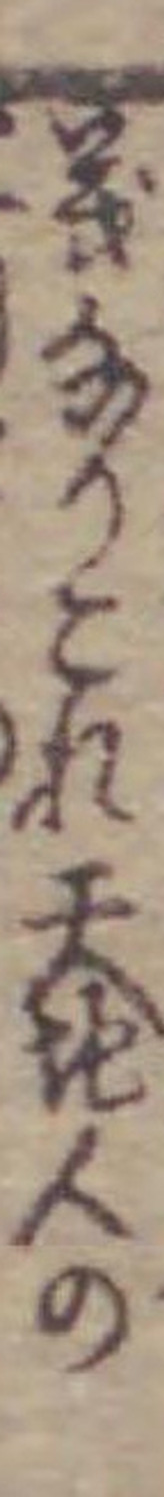義なりこれ天地人の
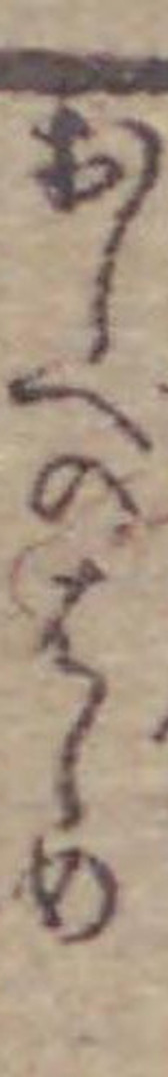おしへのはしめ
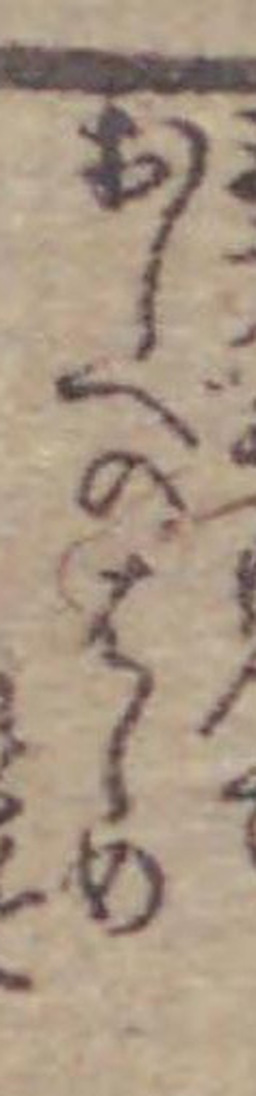おしへのはしめ
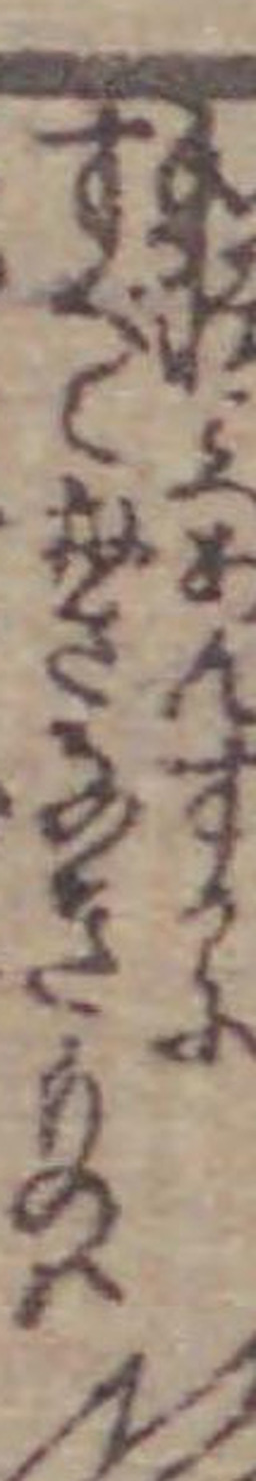すべておさなきものは
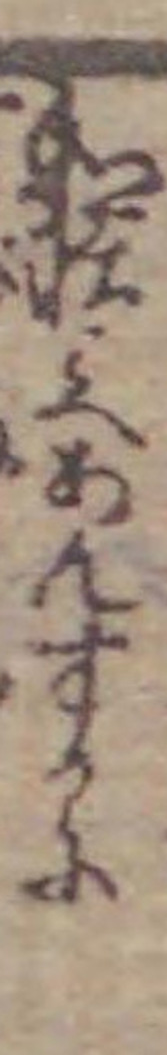和荘兵へあんするに
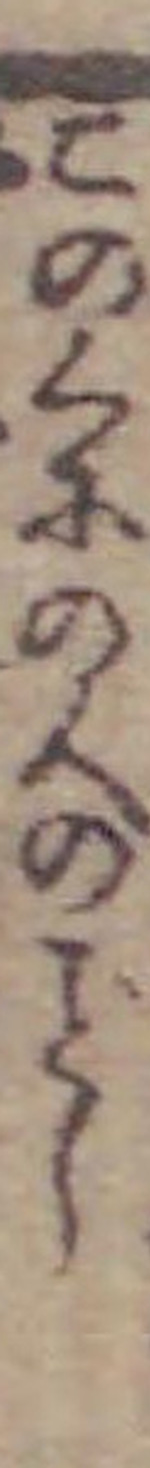このくにの人のごとし
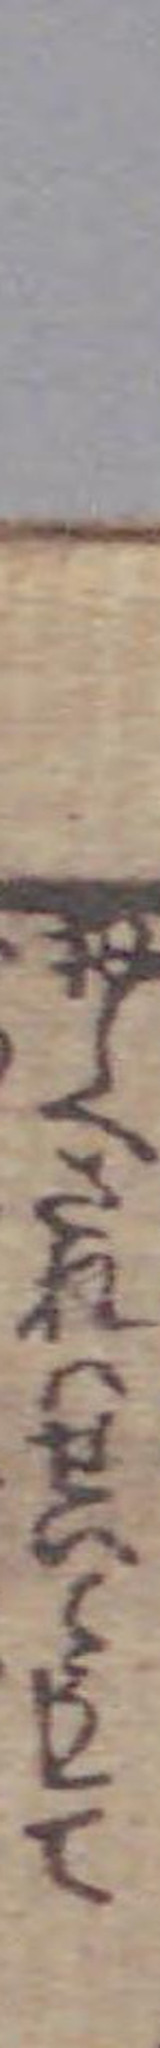おしへされはせいてうして
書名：和荘兵衛後日話 : 3巻
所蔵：国立国会図書館 National Diet Library, JAPAN
